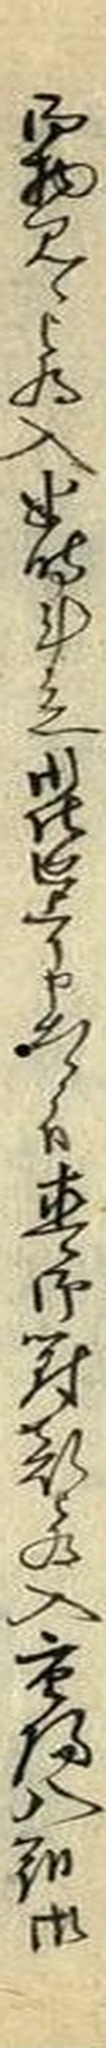御物見へ被為入半時斗立御仕廻上り申出候ニ付直ニ御対顔被為入重陽八朔御
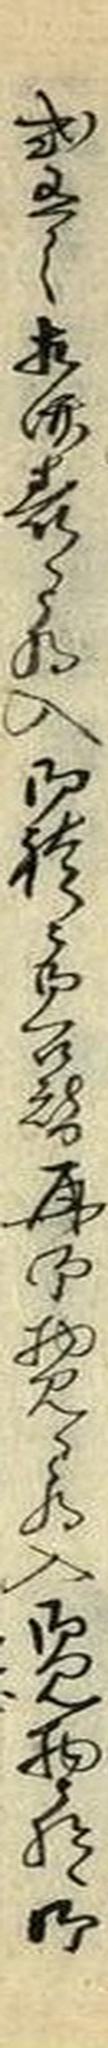式有之相済表へ被為入御袴ニ御召替再御物見被為入御見物被遊候御
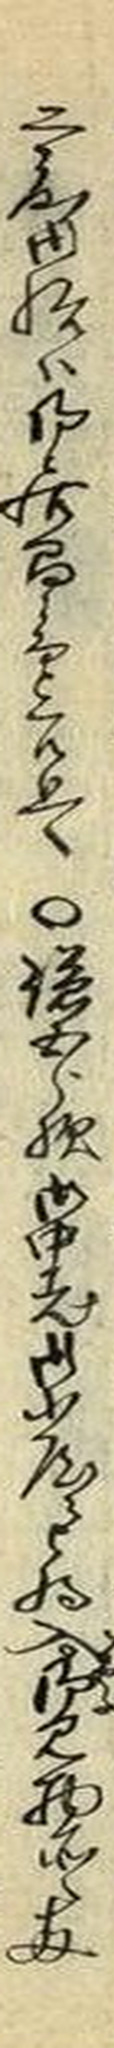二度御膳ハ御居間ニ而差上候○謙五郎様御中老御小屋ニ被為入候処御見物所へ両
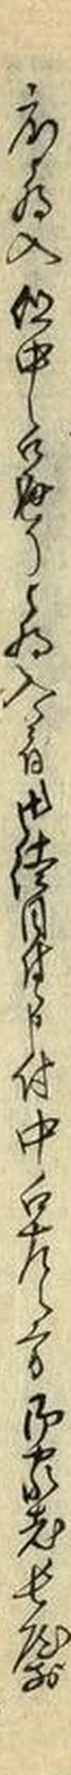度被為入但中之口通り被為入候ニ付御徒目付へ申付中ノ口左之方御家老長屋前
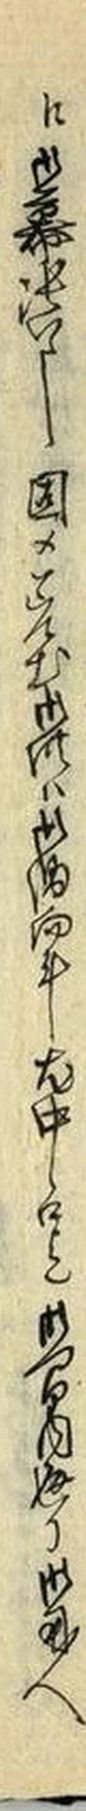江御幕張いたし固メ差出御供ハ御側向斗尤中之口迄御間内通り御用人
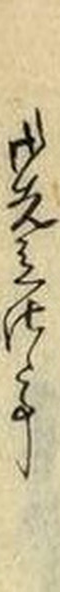御先立仕候事
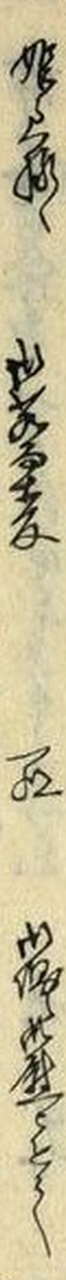姫君様へ御蕎麦一組御側御慰ニ被進之
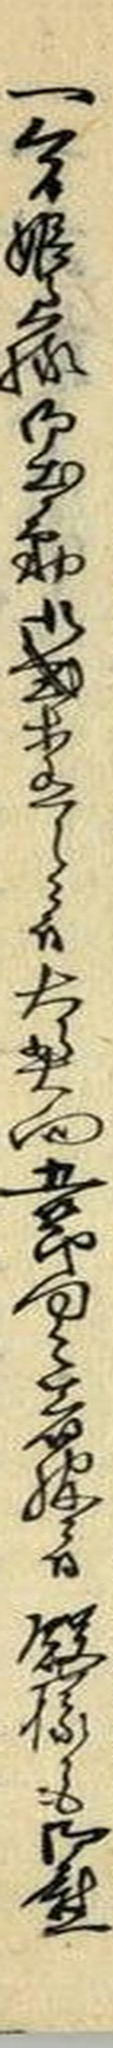一今日姫君様御出勤御式等有之候ニ付大奥向五節句之着服ニ付殿様ニも御熨
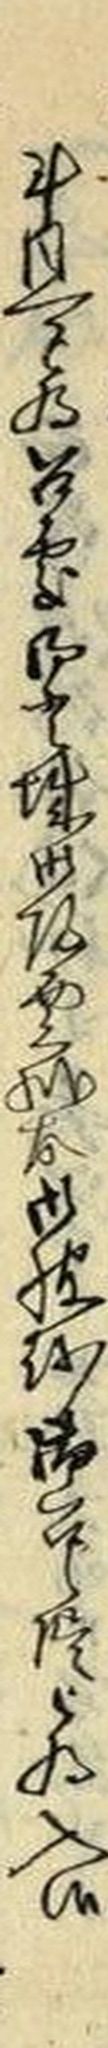斗目可被為召候処御登城御帰殿掛故御服紗御召候侭被為入候
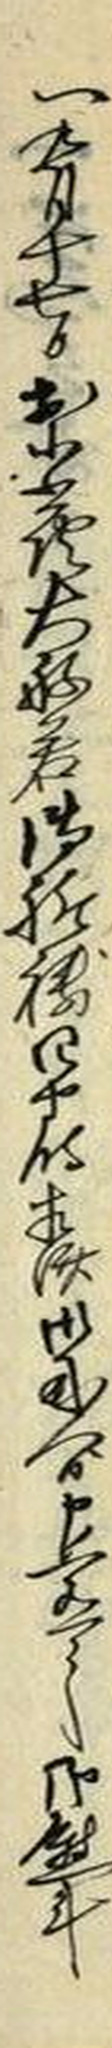一九月十七日於小書院大般若御祈祷四半時相済御用人ゟ申上有之御熨斗
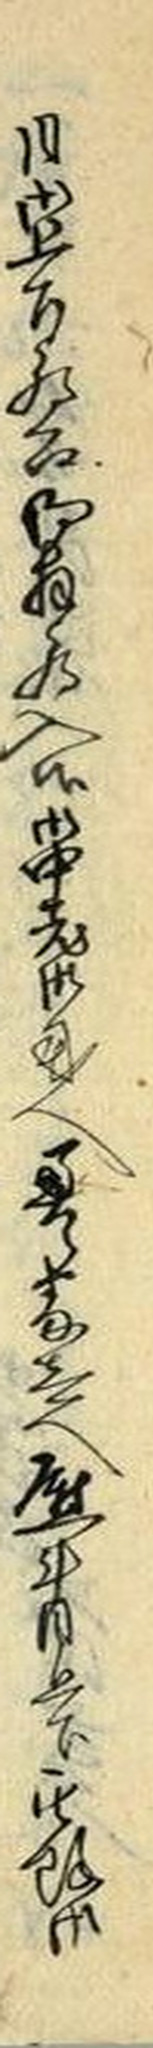目御上下為被召御拝被為入候御中老御用人奥之番壱人熨斗目上下其餘御
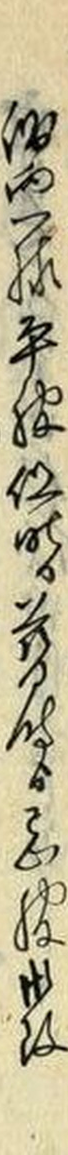側向一統平服但昨日暮時ゟ忌服御改
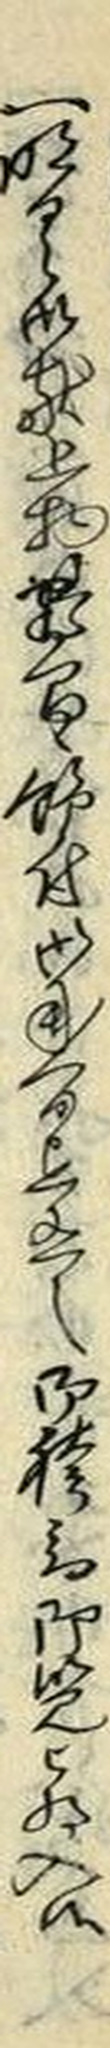一昨日之御献上物鶴之間へ飾付御用人ゟ申上有之御袴ニ而御覧被為入候
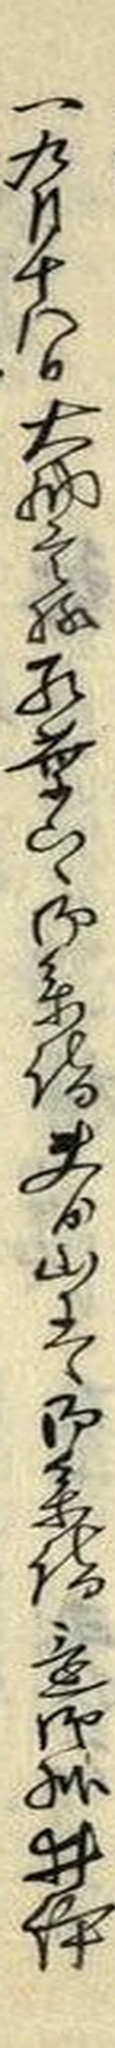一九月十八日大納言様紅葉山へ御参詣夫ゟ山王へ御参詣還御掛井伊
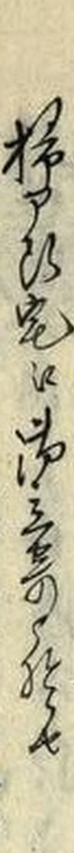掃部頭宅江御立寄被遊候由
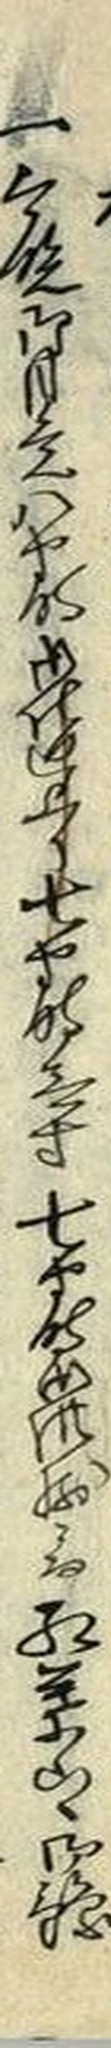一今晩御月見八半時御仕廻上り七半時壱寸七半時御供揃ニ而紅葉山へ御豫
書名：少傅日録抄（斉承付側向頭取日記、在府）
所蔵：福井県文書館 Fukui Prefectural Archives
